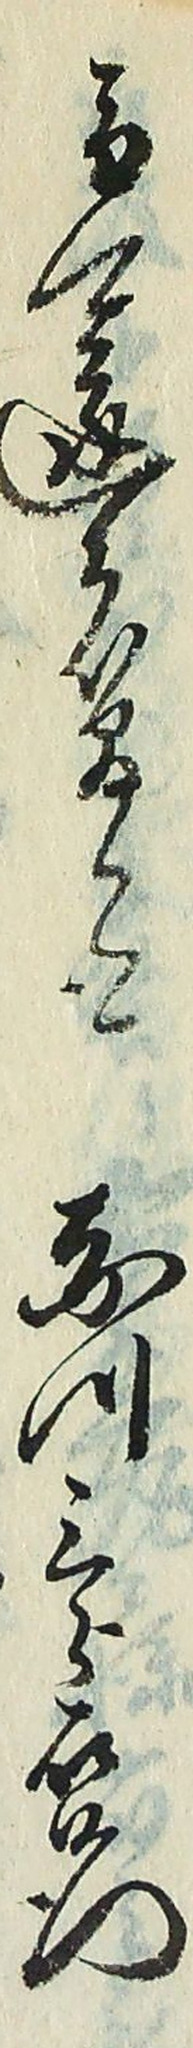旨可遂了簡候以上赤川三郎右衛門
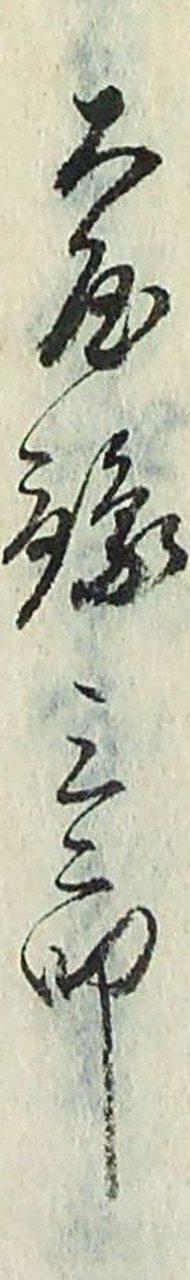大屋豫三郎
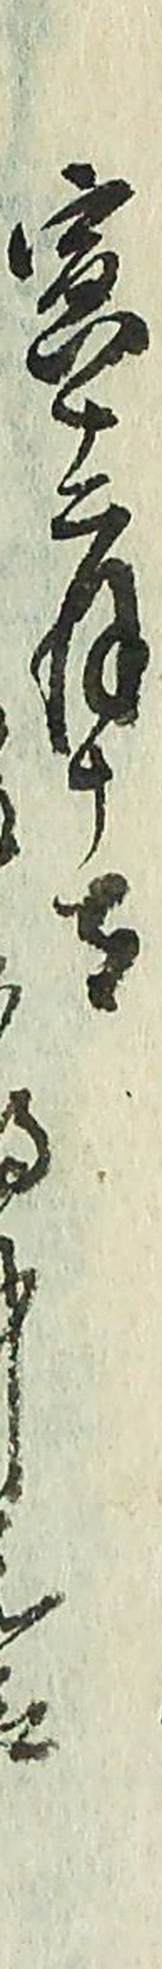寅十二月十七日
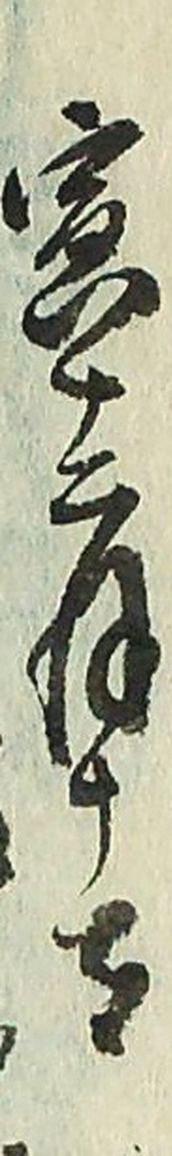寅十二月十七日
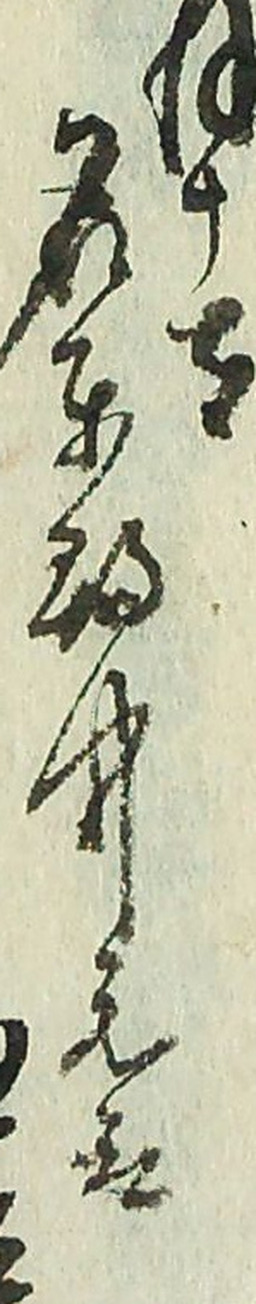名東郡中元取
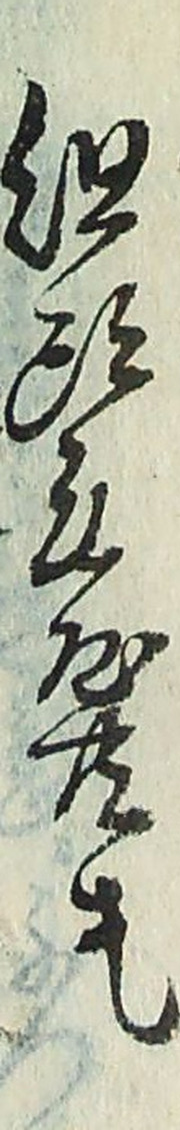組頭庄屋共方へ
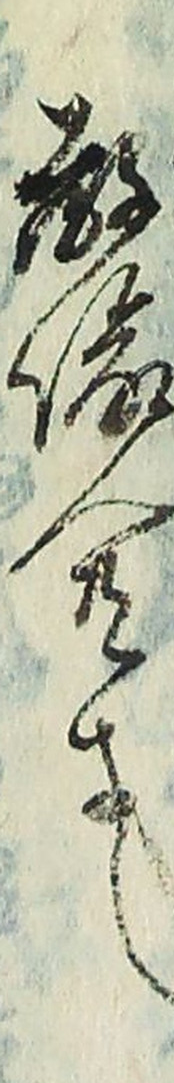教諭人共方へ
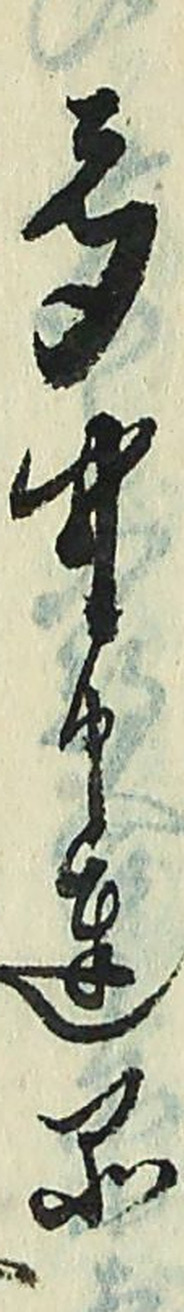元〆中申達品
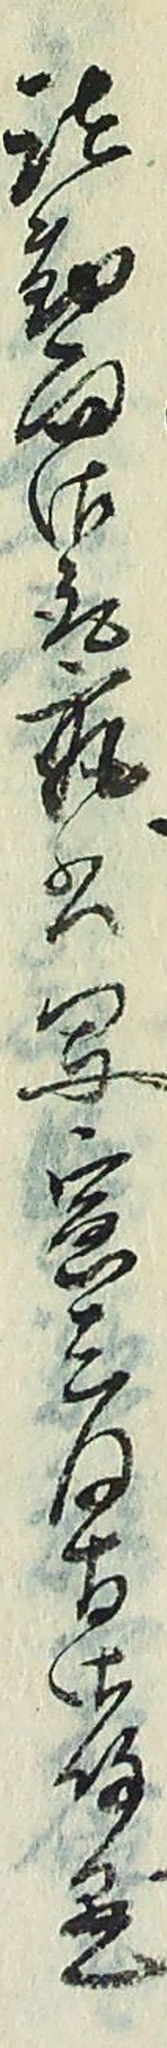諸勤向御取究書写寅十二月十日御呼懸
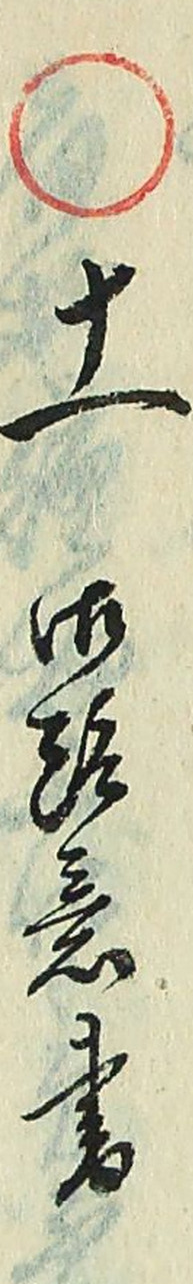○十一御趣意書
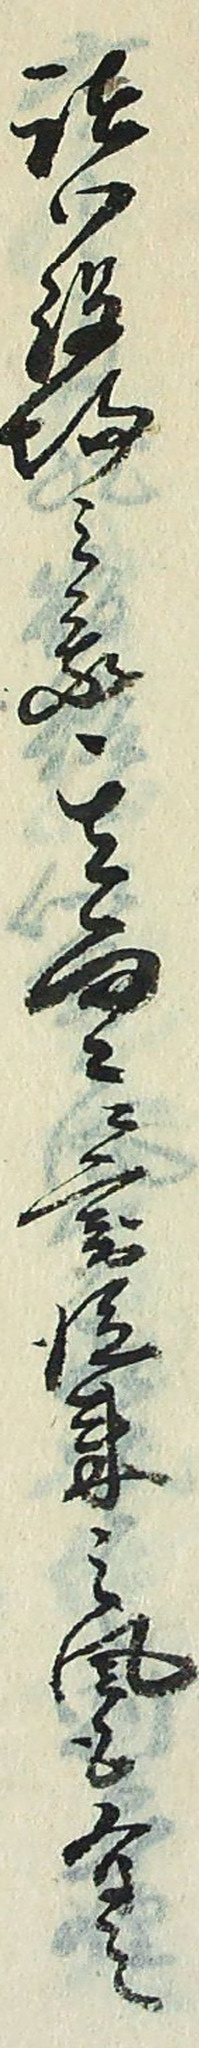諸御役場之義其向々ニ寄従来之風も有之
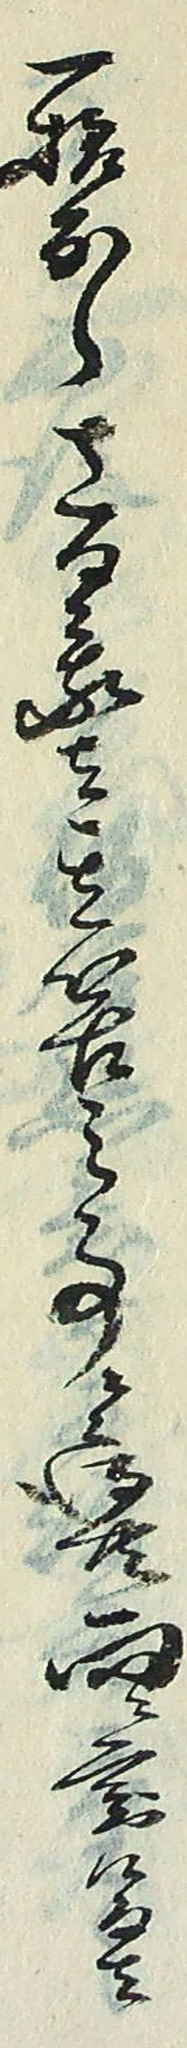一様ならさる義者其筈之事ニ候得共向ニ寄候而者
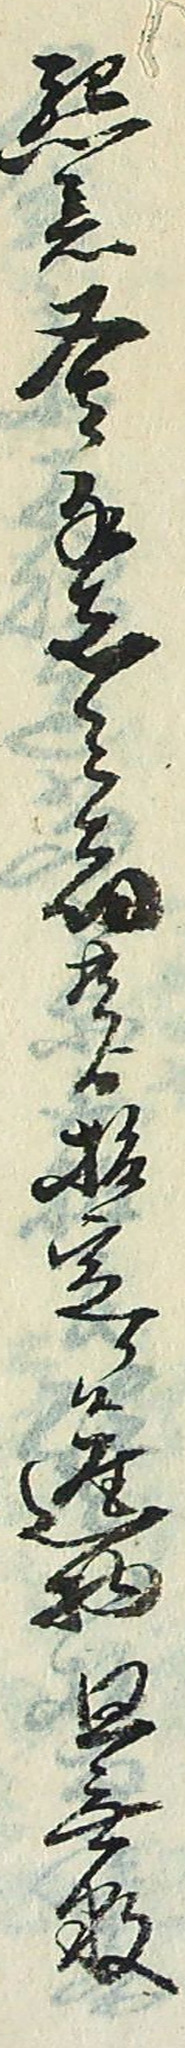懇意又者手元之者共ゟ指定り候進物且無数
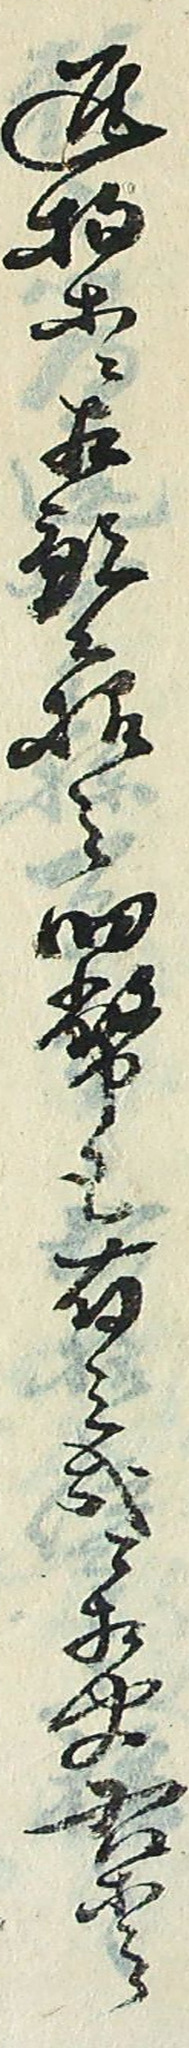進物等ニ相預候様之旧弊も有之哉ニ相聞右等之
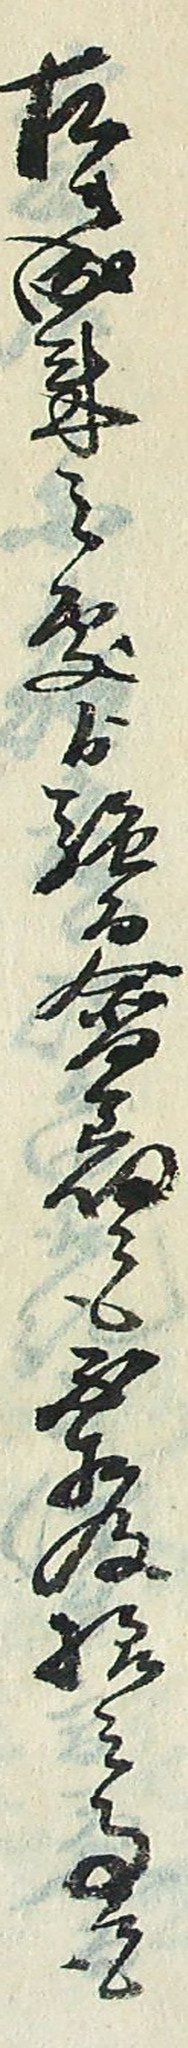古キ成来之處ゟ強而貪着ニも不相及様之事ニも

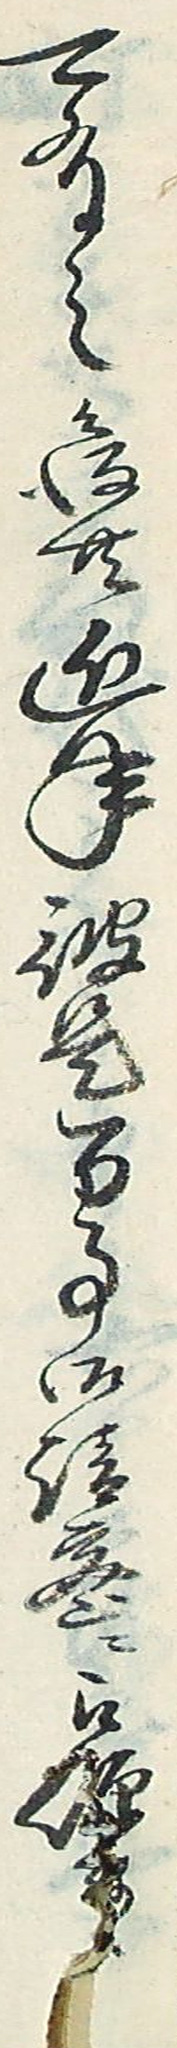可有之候得共近年彼是万事清密ニ被仰付候
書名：諸御趣意書并御下知向之写
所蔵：鳴門教育大学 Naruto University of Education
